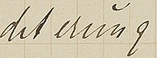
von dem sie
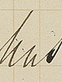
das
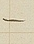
Darum
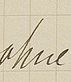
habe ich
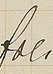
seit
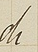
ohne
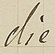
unsern
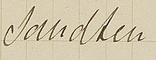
sandten
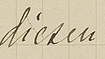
Regierung
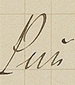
über
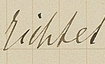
unter-
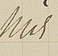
soll
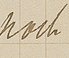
geschehen?
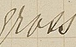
Theilen
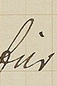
mir
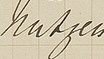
Meinung mit;
